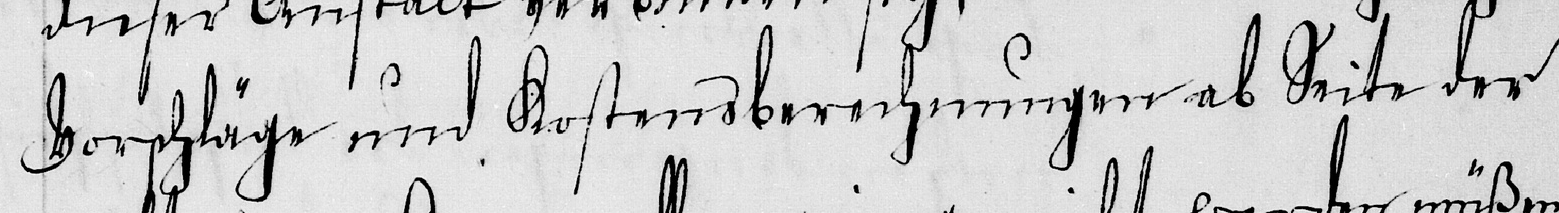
Vorschläge und Kostenberechnungen ab Seite der
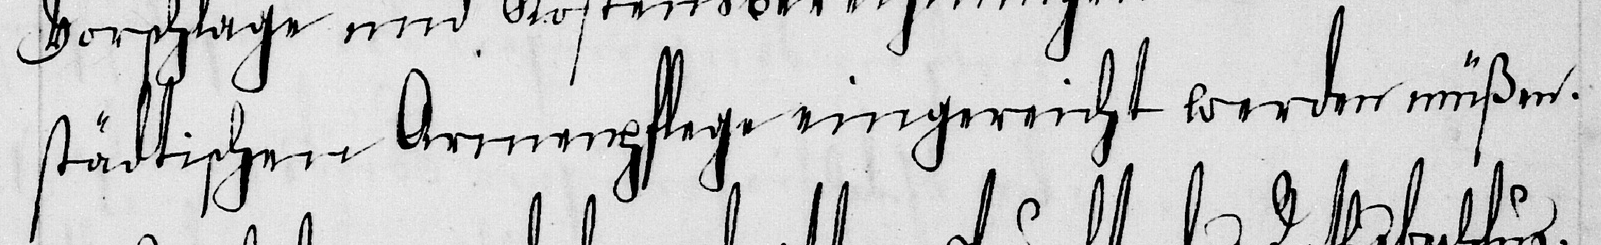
städtischen Armenpflege eingereicht werden müßen.
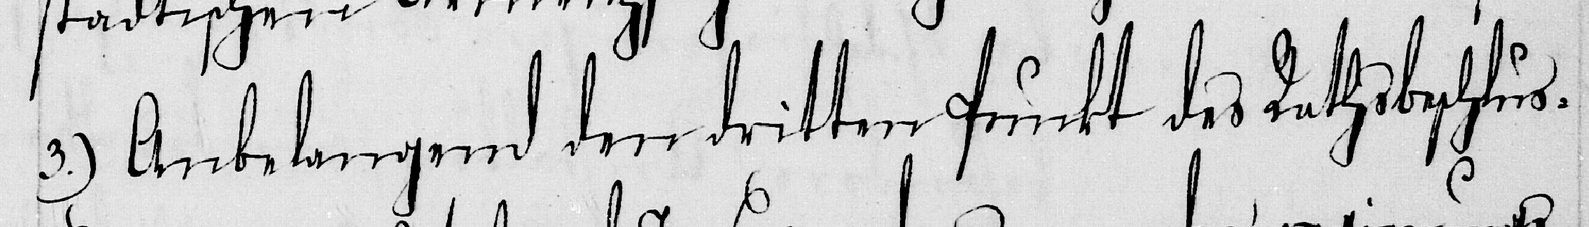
3.) Anbelangend den dritten Punkt des Rathsbeschlu¬
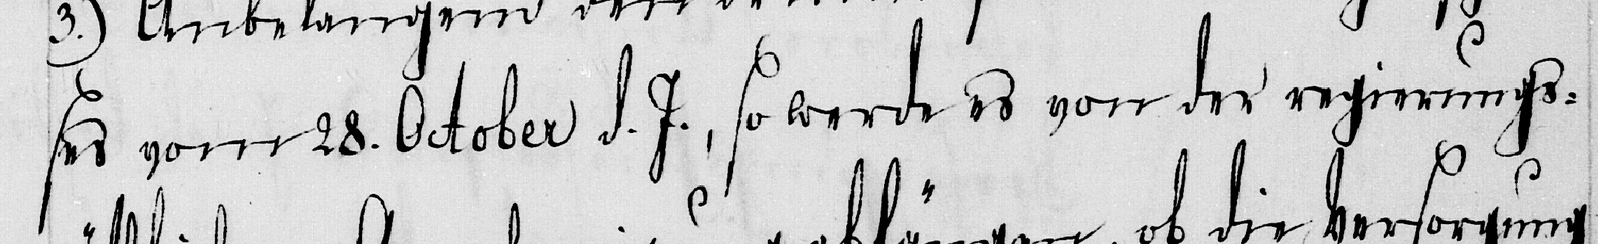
ßes vom 28. October d. J., so werde es von der regierungs¬
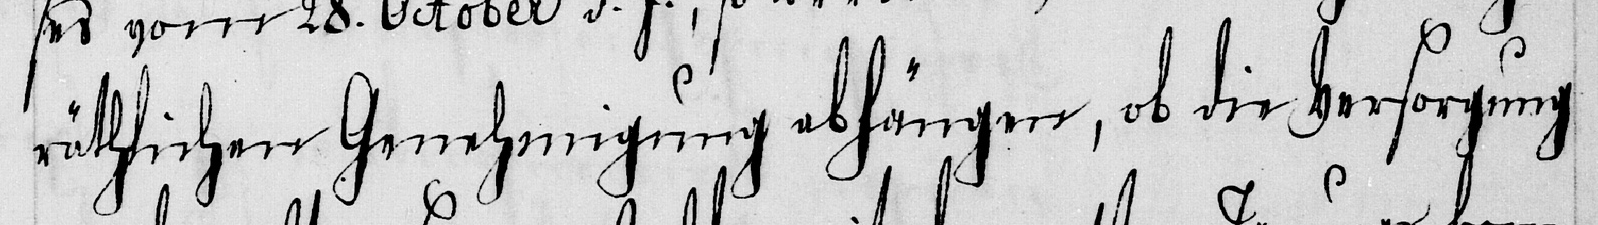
räthlichen Genehmigung abhängen, ob die Versorgung
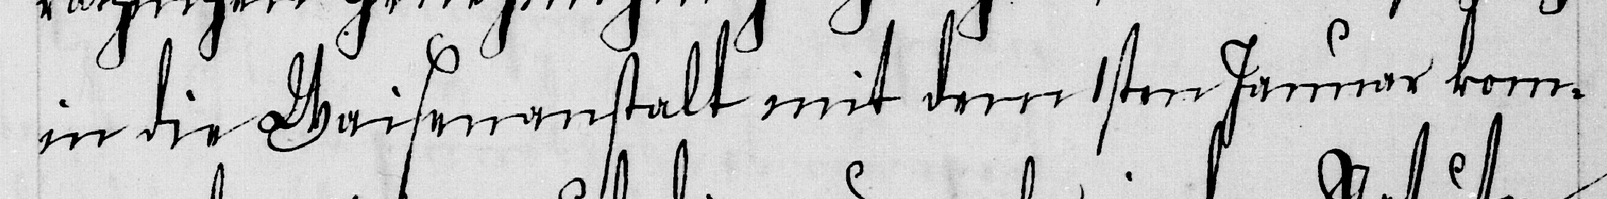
in die Waisenanstalt mit dem 1sten Januar kom¬
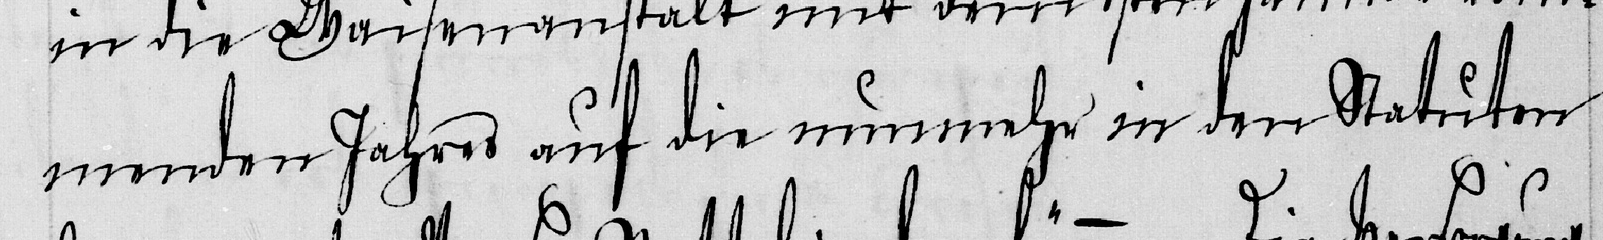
menden Jahres auf die nunmehr in den Statuten
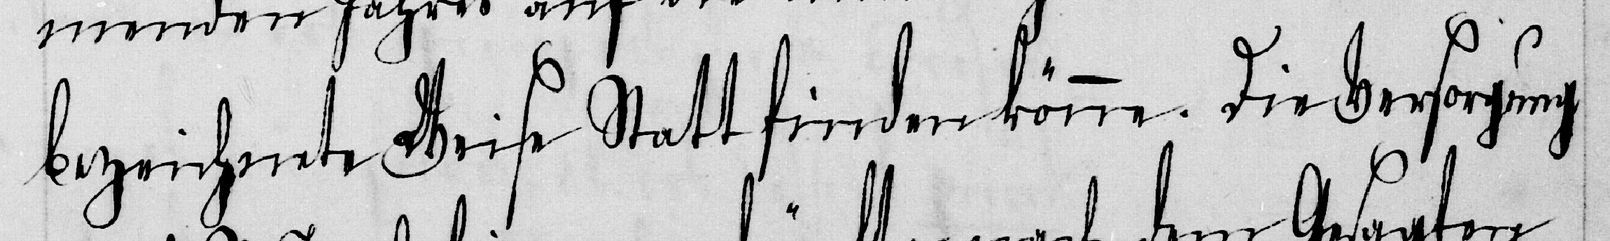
bezeichnete Weise Statt finden könne. Die Versorgung
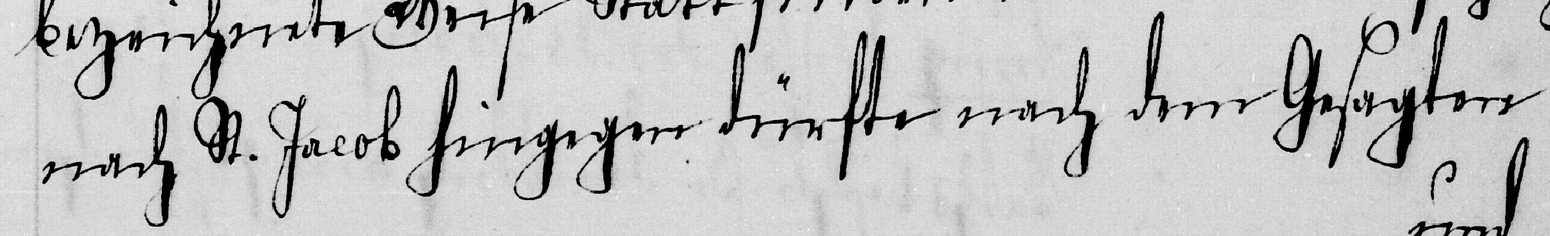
nach St. Jacob hingegen dürfte nach dem Gesagten
